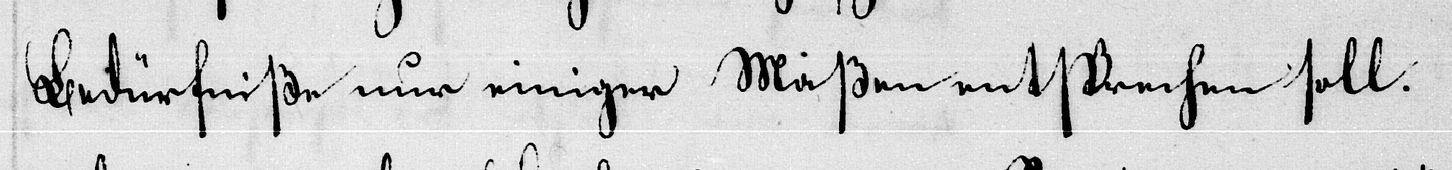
Bedürfniße nur einiger Maßen entsprechen soll.
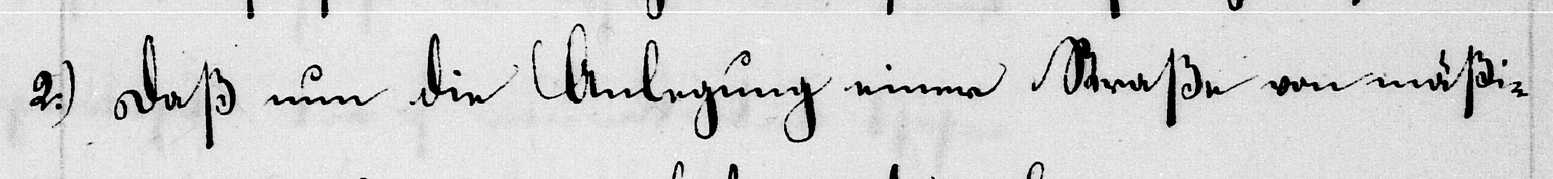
2.) Daß nun die Anlegung einer Straße von mäßi¬
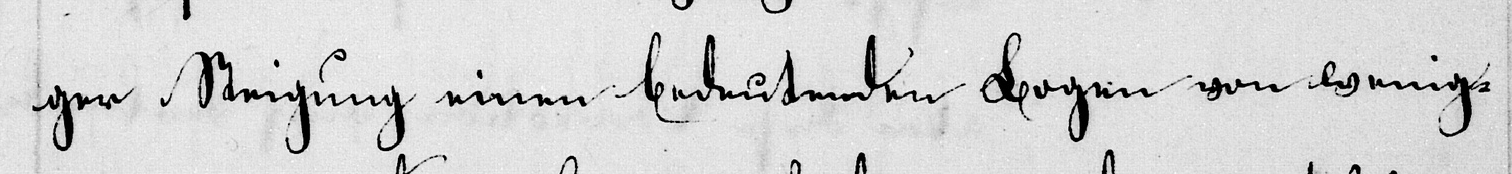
ger Steigung einen bedeutenden Bogen von wenig¬
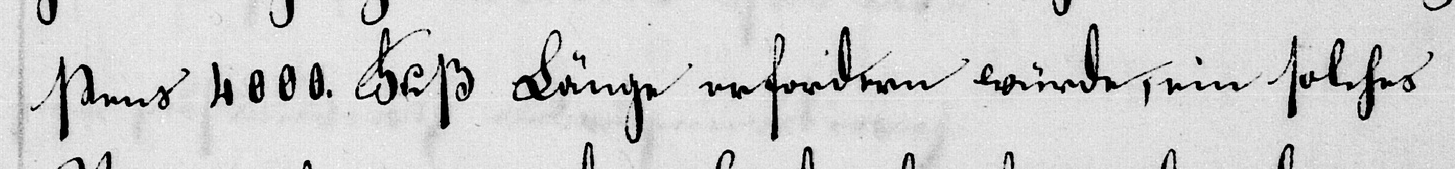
stens 4000. Fuß Länge erfordern würde, ein solches
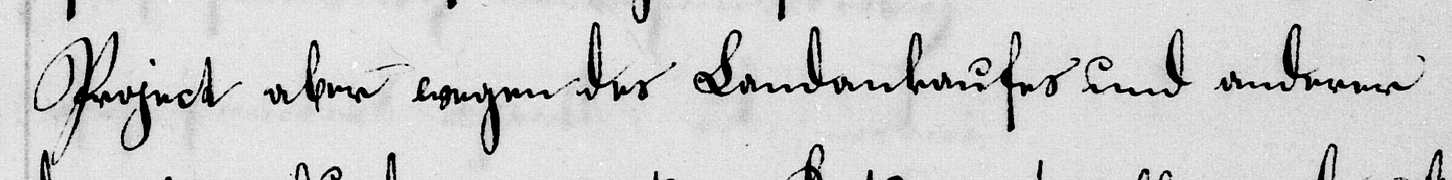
Project aber wegen des Landankaufes und anderer
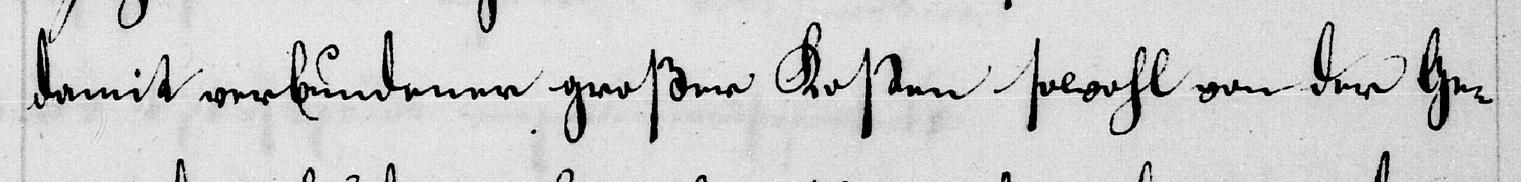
damit verbundener großer Kosten sowohl von der Ge¬
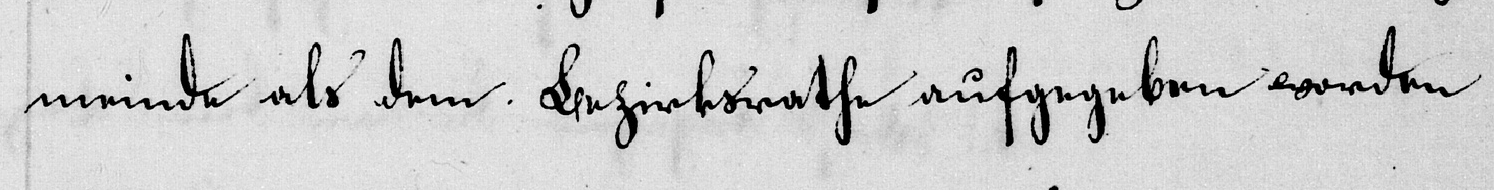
meinde als dem Bezirksrathe aufgegeben worden
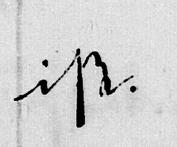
ist.
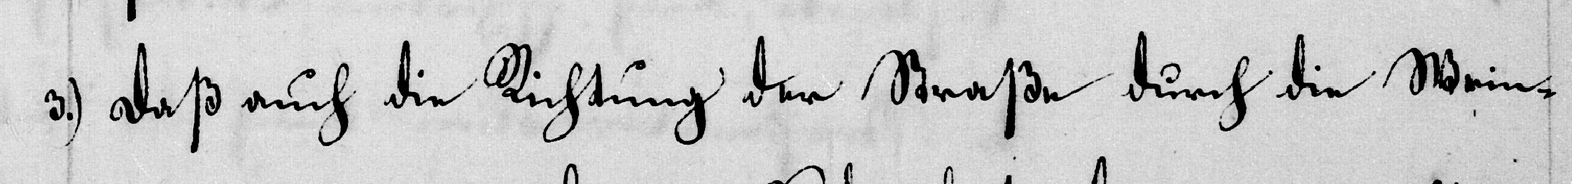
3.) Daß auch die Richtung der Straße durch die Wein¬
